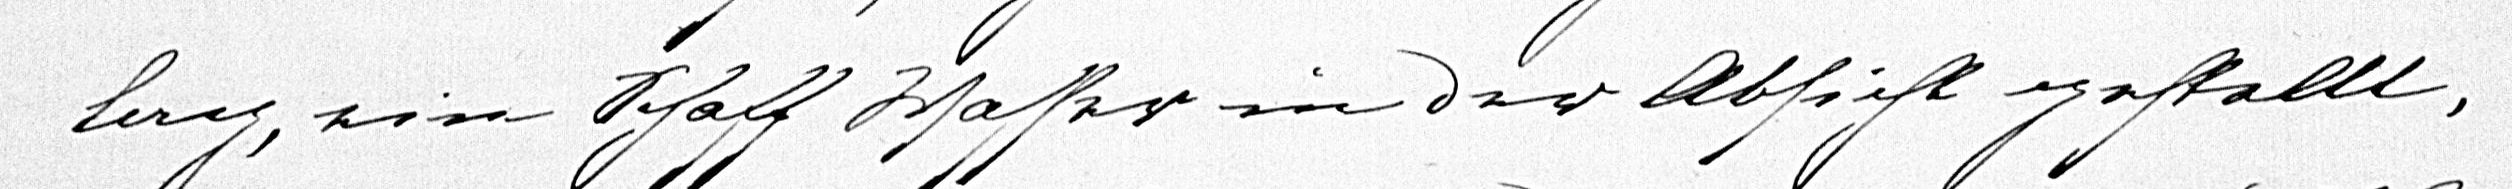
lag, ein Schoff Wasser in der Absicht gestellt,
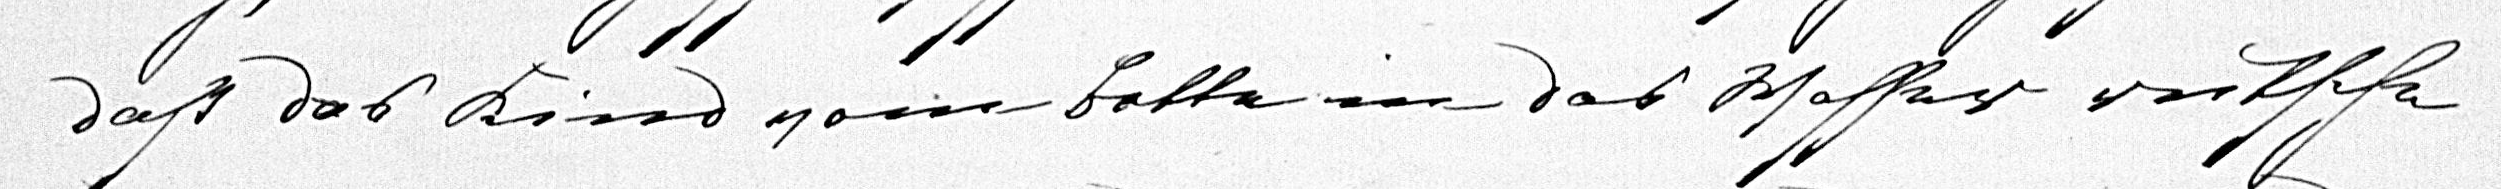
daß das Kind vom Bette in das Wasser rexxsche
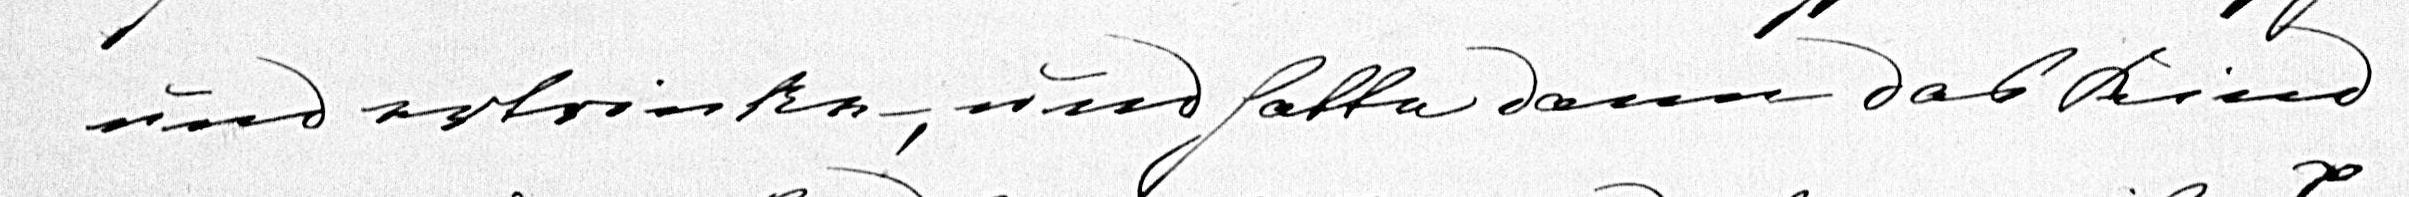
und ertrinke-, und hatte dann das Kind
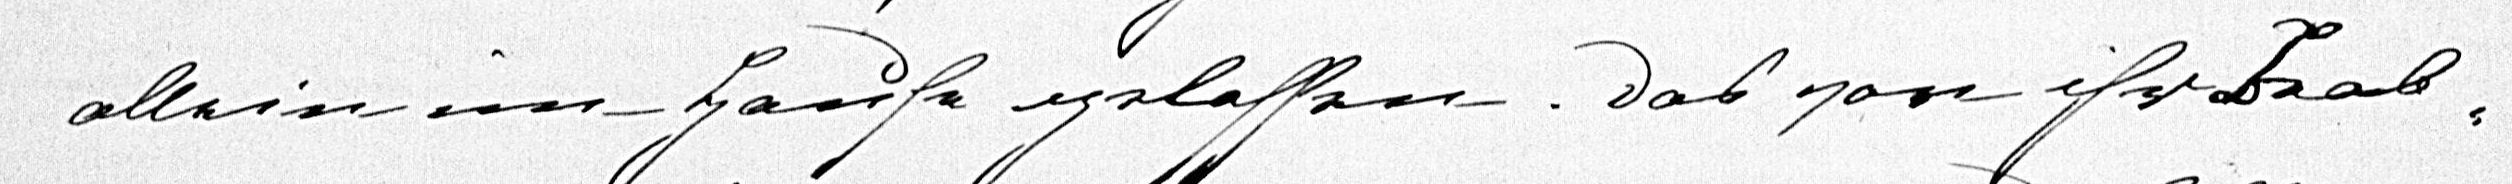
allein im Hause gelassen. Das von ihr Beab¬
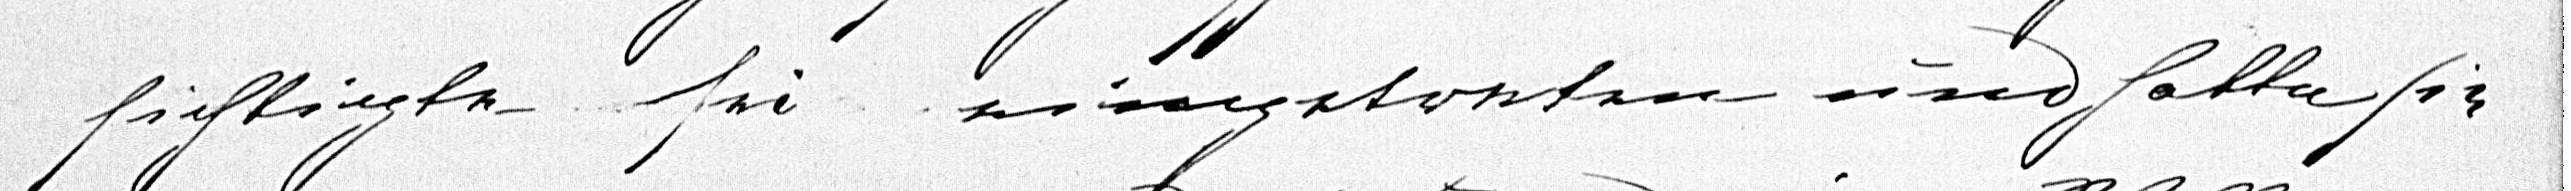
sichtigte sei eingetreten und hatte hie¬
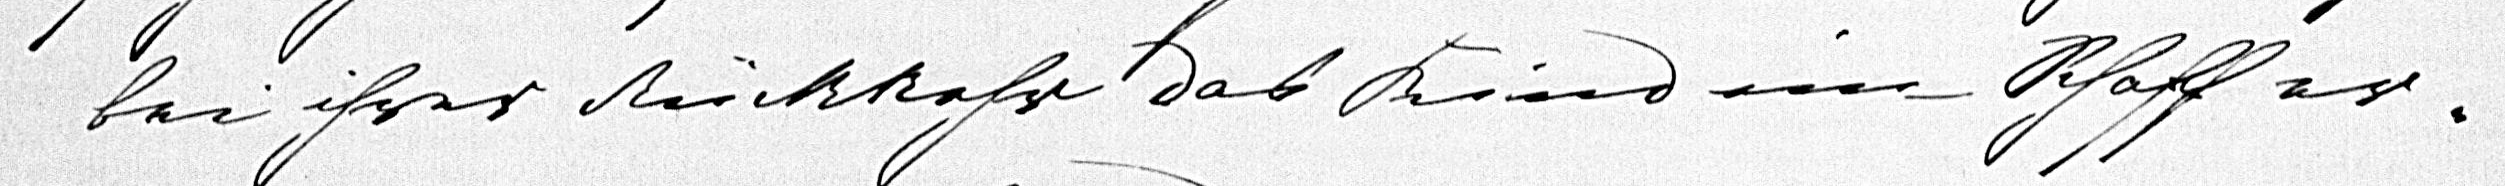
bei ihrer Rückkehr das Kind im Schaffer¬
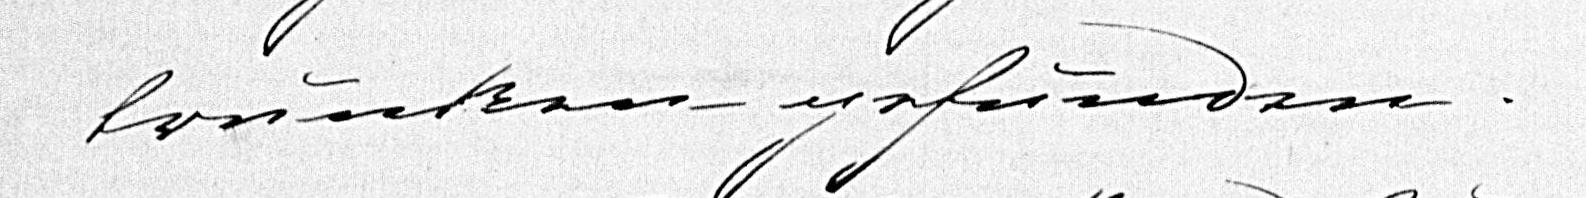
trunken gefunden.
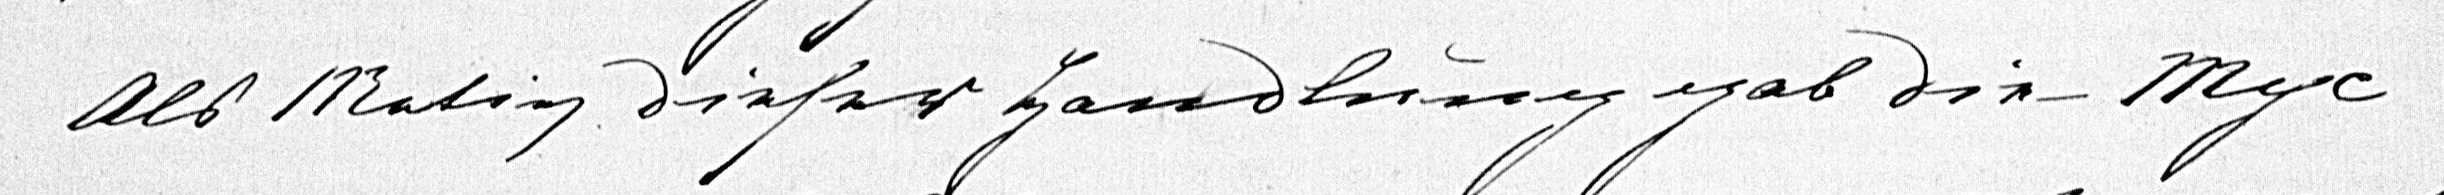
Als Motiv dieser Handlung gab die Myc
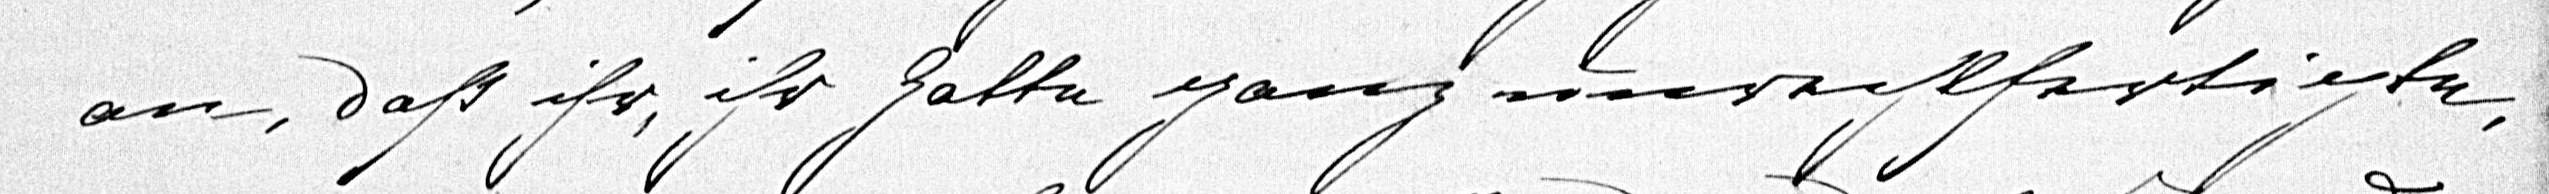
an, daß ihr, ihr hatte ganz unrechtfertigte,
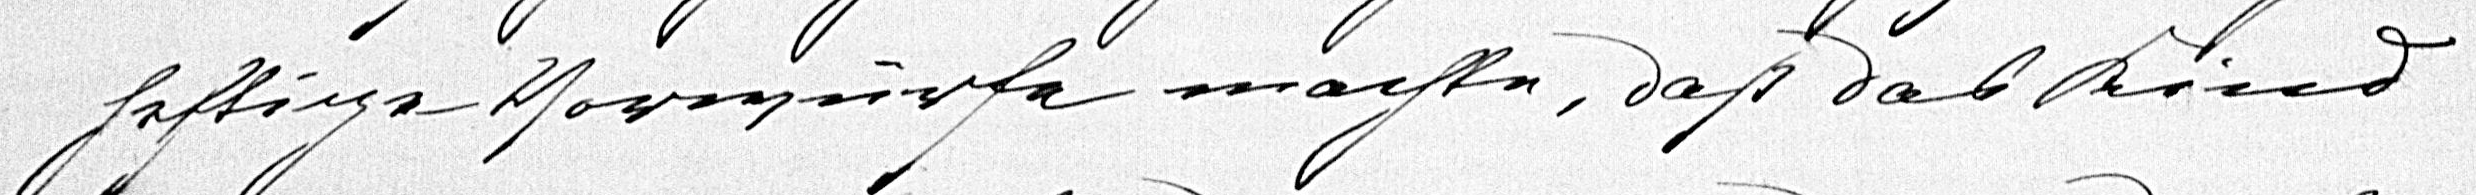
heftige Vorwürfe machte, daß das Kind
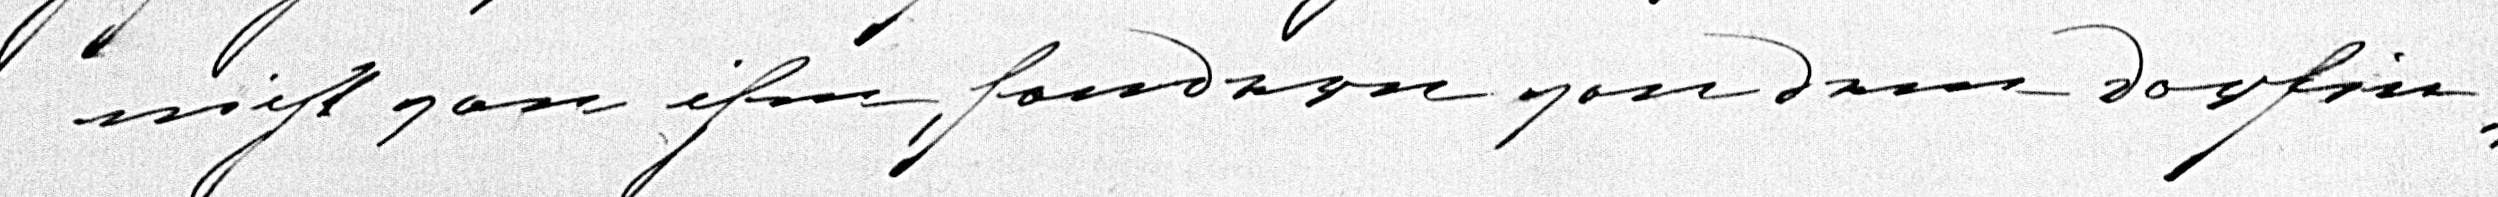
nicht von ihm, sondern von dem Dorfin-
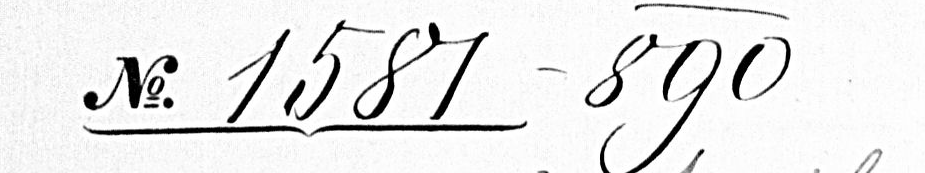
Nr. 1581-890
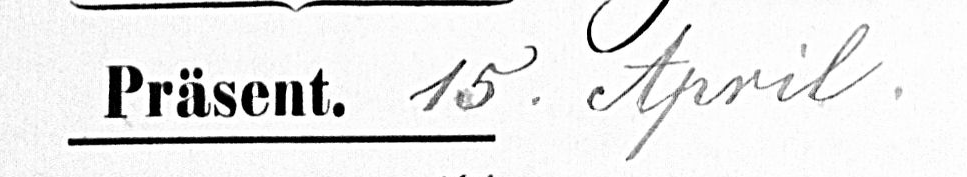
Präsent. 15. April.
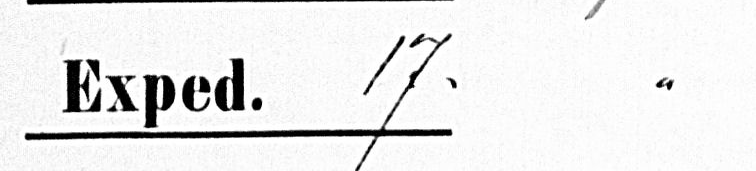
Exped. 17. April.
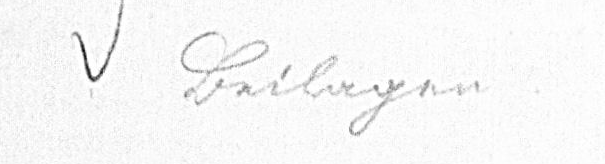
Beilagen
